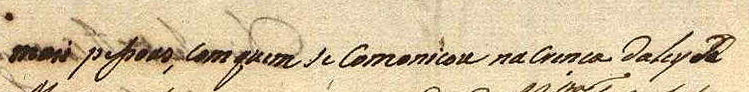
mais pessoas, com quem se comonicou na crença da ley de
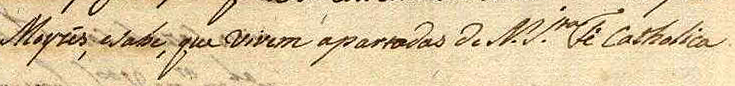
Moyzés, e sabe, que vivem apartadas de N. S.ta Fé Catholica
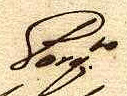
Porq.to
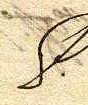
P.
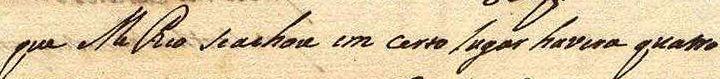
que elle Reo se achou em certo lugar havera quatro
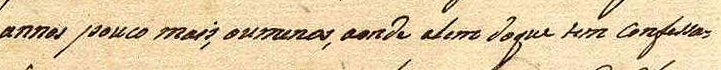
annos pouco mais, ou menos, aonde alem do que tem confessa
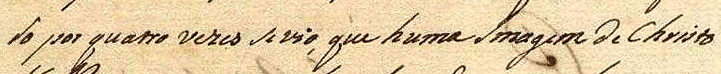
do por quatro vezes se vio, que huma Imagem de Christo
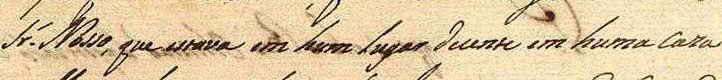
Sr̄. Nosso, que estava em hum lugar decente em huma caza
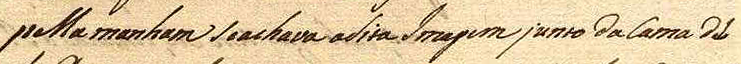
pella manham se achava a dita Imagem junto da Cama de
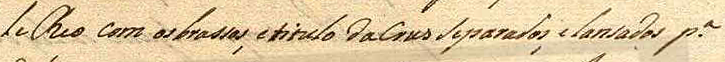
le Reo com os brassos, e titulo da Crus separados e lansados p.a
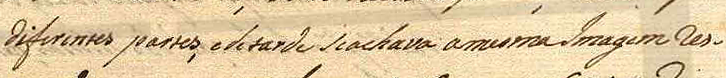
diferentes partes, e de tarde se achava a mesma Imagem Res
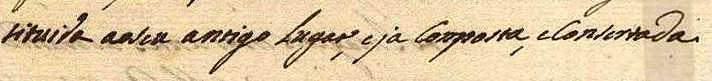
tituida ao seu antigo Lugar, e ja Composta, e consertada.
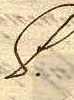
P.
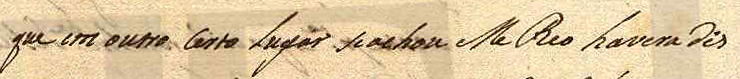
que em outro certo Lugar se achou elle Reo havera dés
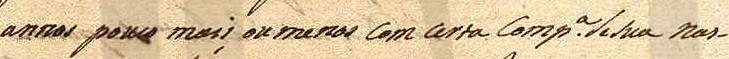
annos pouco mais, ou menos com certa comp.a de sua nas
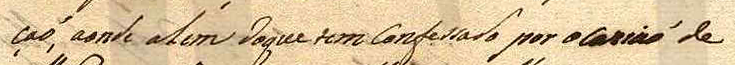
çaõ, aonde alem do que tem confessado por ocaziaõ de
